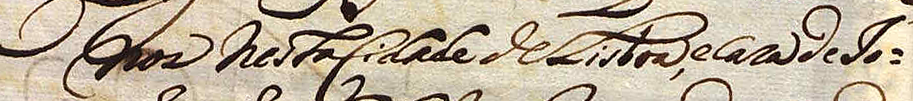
noz nesta Cidade de Lisboa, e caza de Io
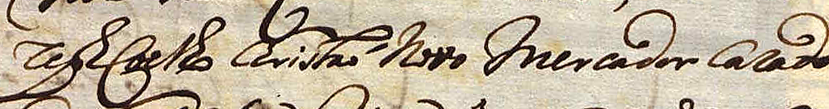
zeph Coelho Christaõ novo Mercador cazado
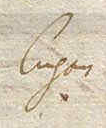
lugar
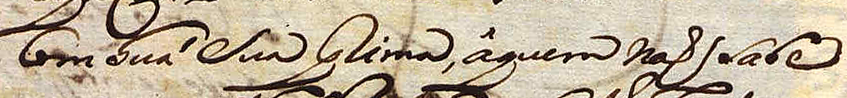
Com huā Sua pRima, á quem naõ sabe
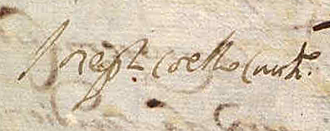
Iozeph. coelho Cout.o
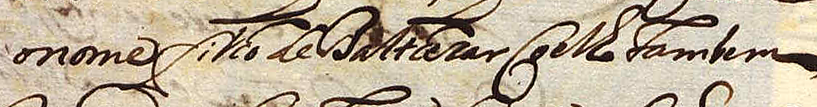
o nome filho de Balthezar Coelho tambem
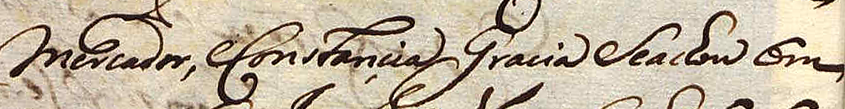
mercador, e Constancia Gracia Se achou Com
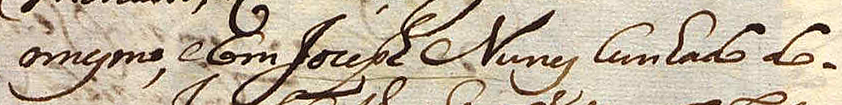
o mesmo, e com Jozeph Nunes Cunhado do
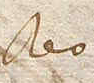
Reo
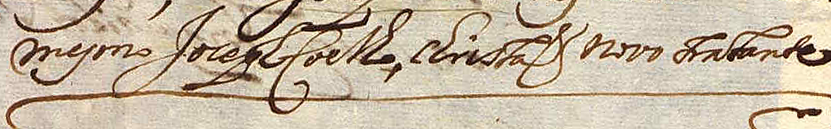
mesmo Jozeph Coelho, christaõ novo tratante
